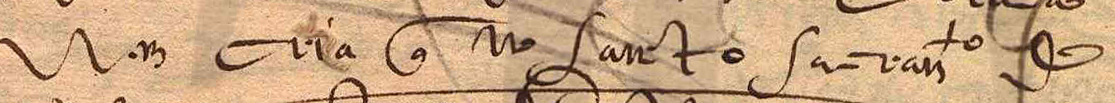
Nem cria q̄ no Sancto Sacramto do
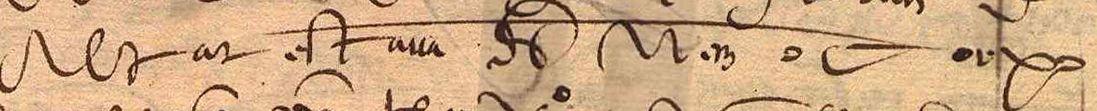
Altar estaua ds̄ Nem o Corpo
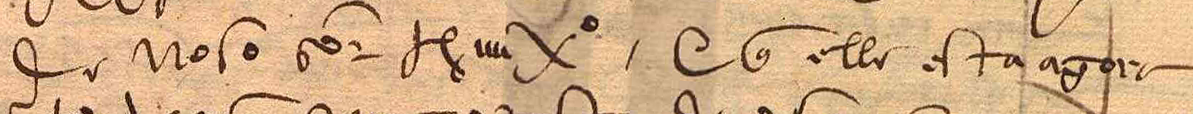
de noso sōr Jhuu Xo / e q̄ elle esta agora
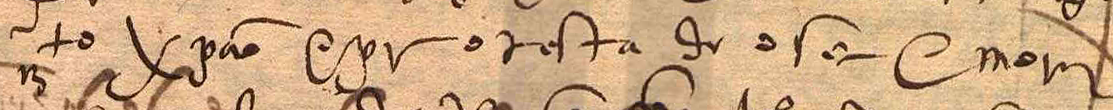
mto Xpão e protesta de o ser e morer
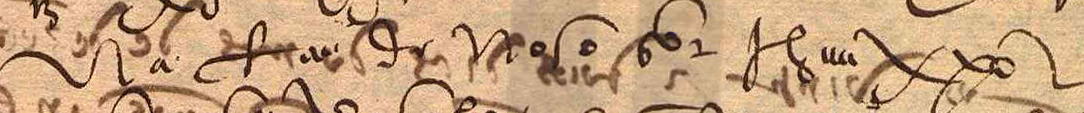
Na fee de noso sōr Jhuū Xpō
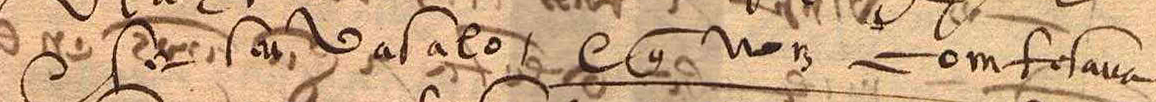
e ser seu Vasalo / e q̄ nom comfesaua
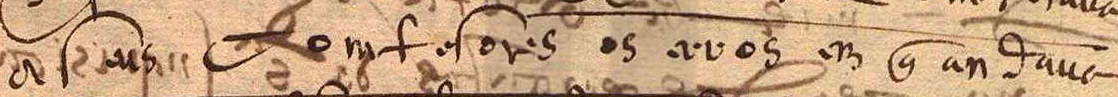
a seus Comfesores os erros em q̄ andaua
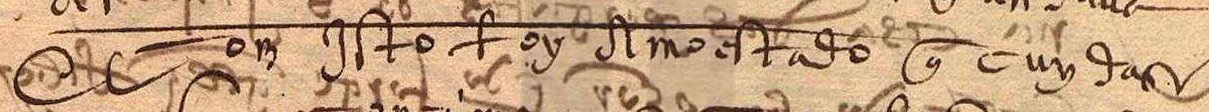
e Com Jsto foy Amoestado q̄ cuydase
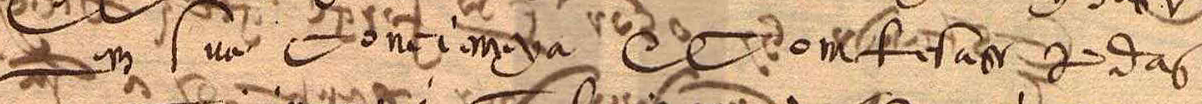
em sua conciemcya e Comfesase todas
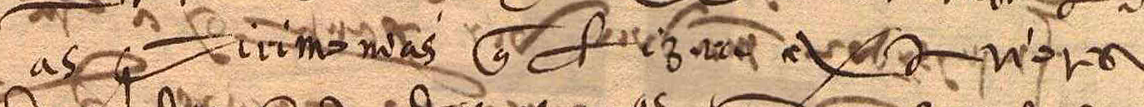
as Cirimonias q̄ fizera eXteriores
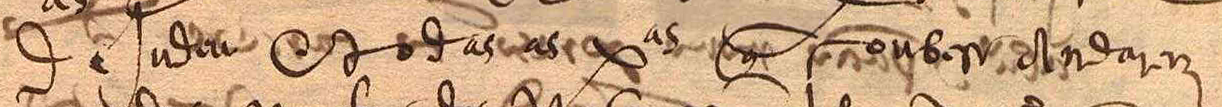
de Judeu e todas as pas q̄ soubese Andarem
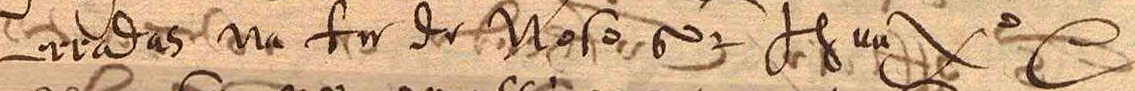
erradas na fee de noso sor̄ Jhuu Xo e
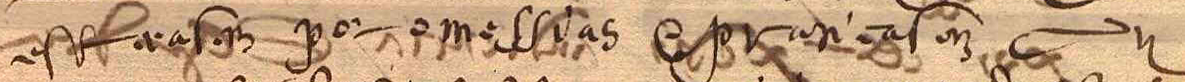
esperasem por o messias e praticasem Com
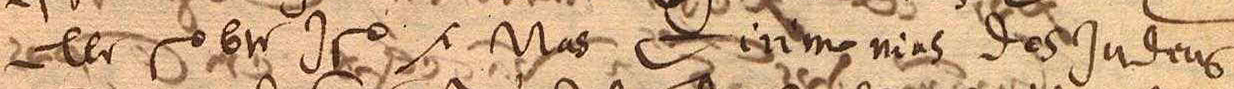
elle sobre Jso e nas cirimonias dos Judeus
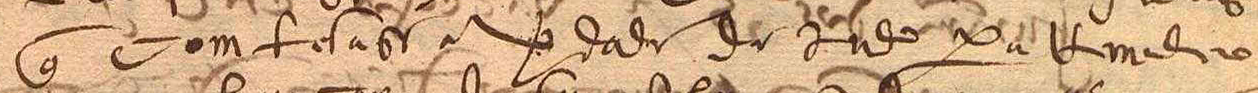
q̄ comfesase a ꝟdade de tudo ꝑa Remedeo
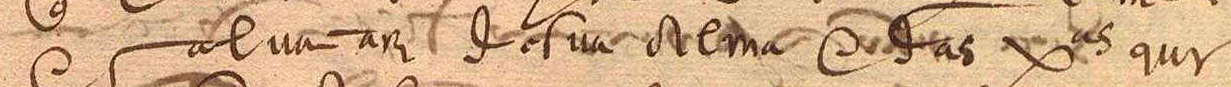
e saluaçam de sua Alma e das pas que
